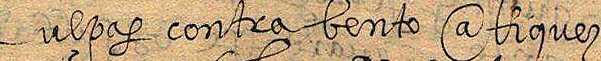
Culpas contra bento āRiquez
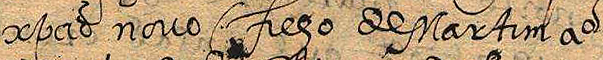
xpaõ nouo (filho de Martim ao
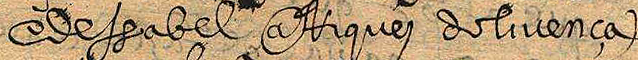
e de Jsabel āRiquez doliuença)
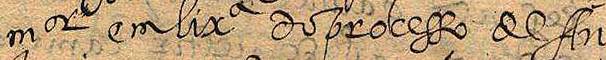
mor em lixa do processo de An
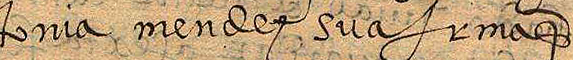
tonia mendez sua Jrmã
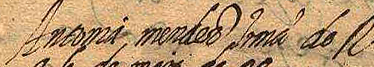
Antonia mendez Irmã do R
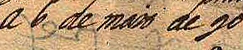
a 6 de maio de 90
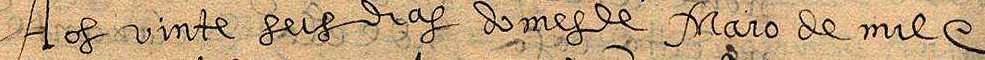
Aos vinte seis dias do mes de Maio de mil e
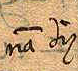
nā diz
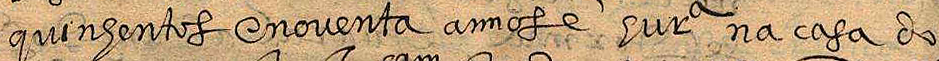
quinhentos e nouenta annos ē Eura na casa do
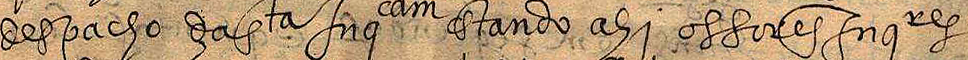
despacho da sta Jnqcam estando ahi os sorēs Jnqres
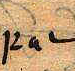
Ra.
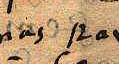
nas Ra.
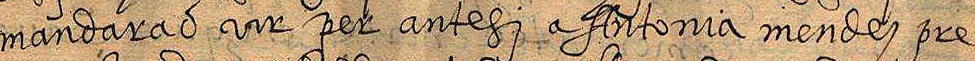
mandaraõ vir perante sj a Antonia mendez pre
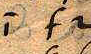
ī f 2
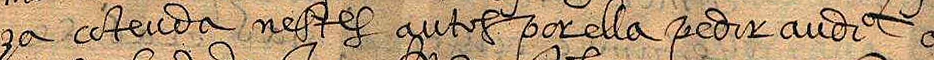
za cōteuda nestes autos por ella pedir audia a
